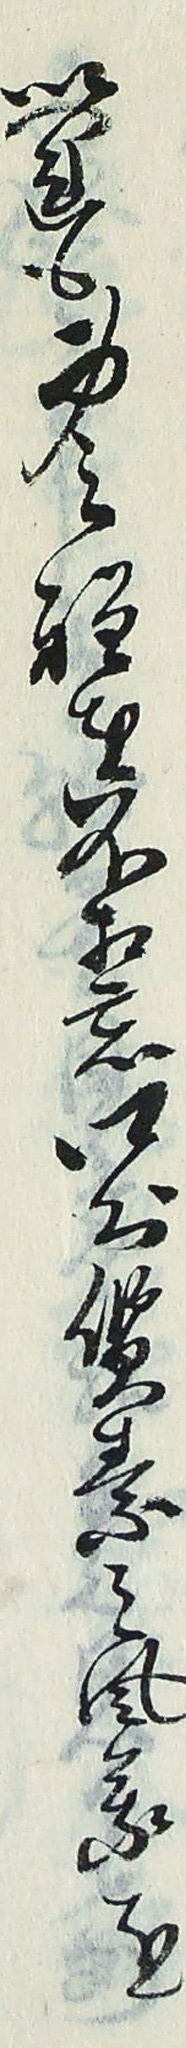いつれも身之程を不相忘郷分質素之風義を
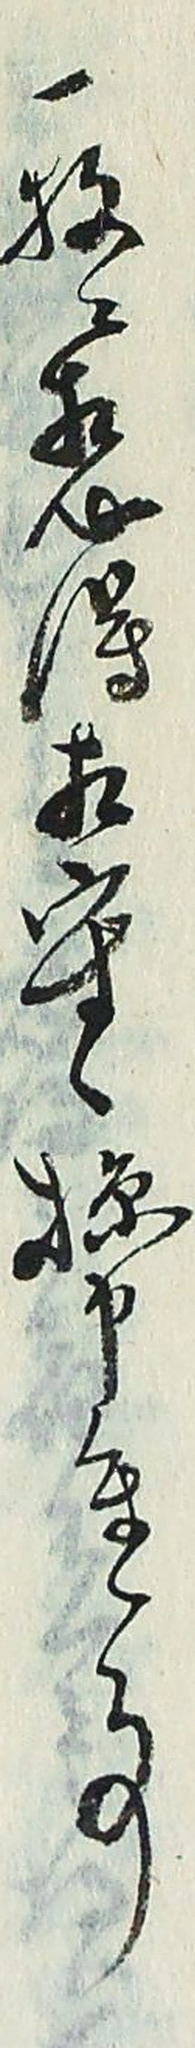一牧ニ相心得相守候様申付候事
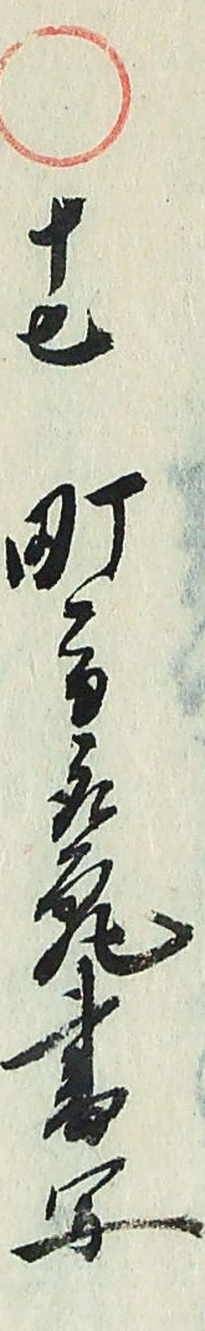○十七町方取究書写
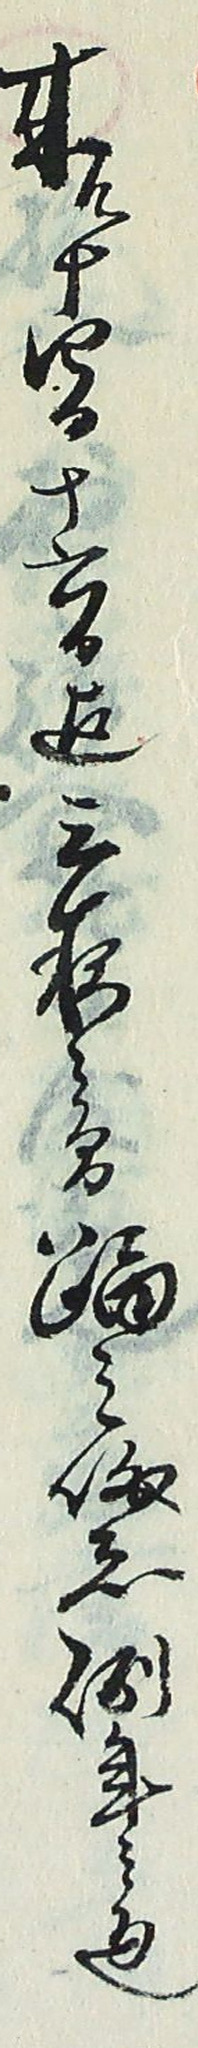来ル十四日十六日迄三夜之間踊之儀者例年之通
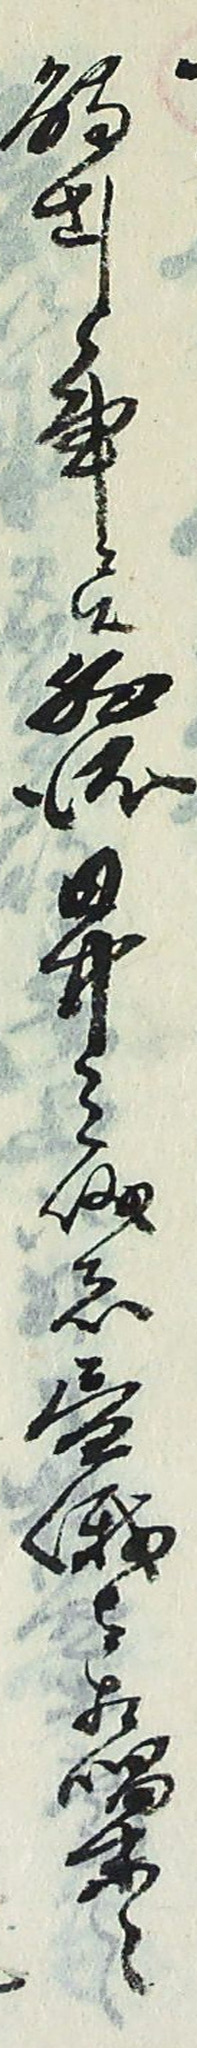触出候事ニ候然所日中之儀者晝俄と相唱末々
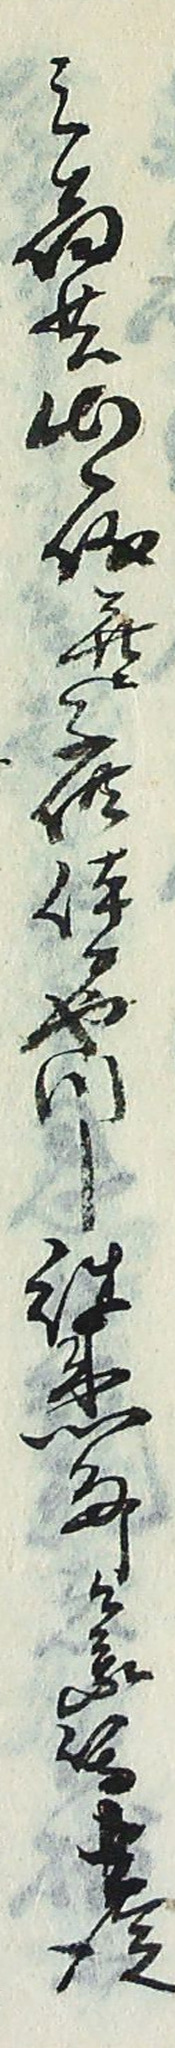之者共出候儀幷ニ子供体ニやつし往来いたし候義等者従
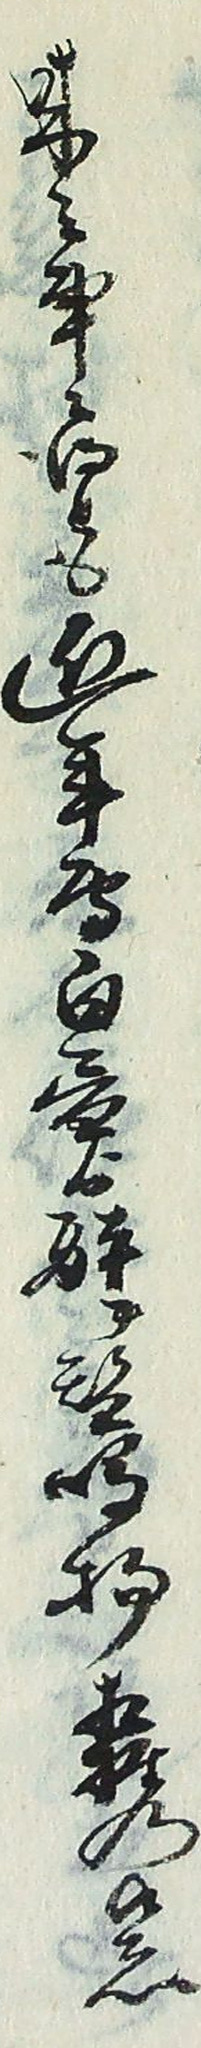来之事ニ候得とも近年専白晝ゟ躰ヲ替鳴持相携候者
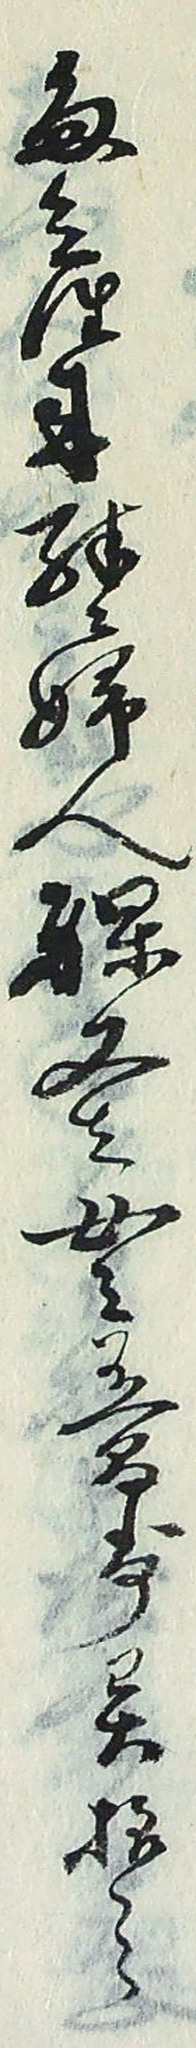多令往来殊ニ婦人裸又者女之有間布異様之
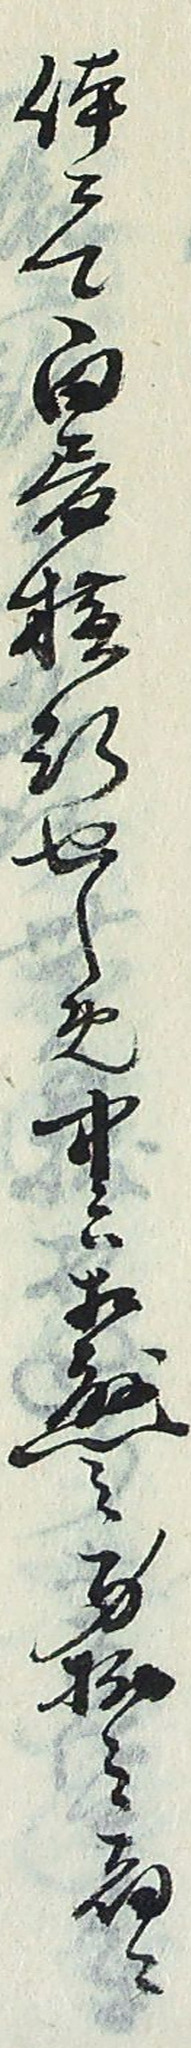体ニて白晝横行せしめ中ニハ相懸之身柄之者ニ
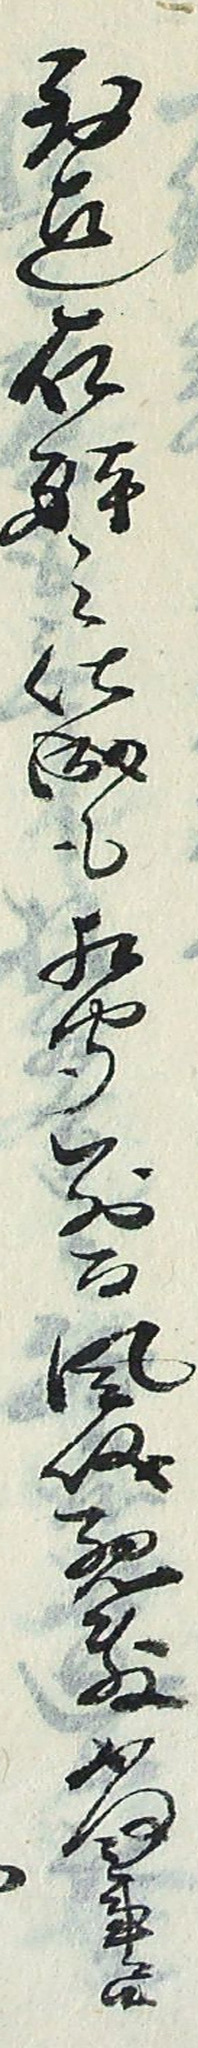到迄右躰之仕成も相聞別而風儀悪敷如何之事ニ候
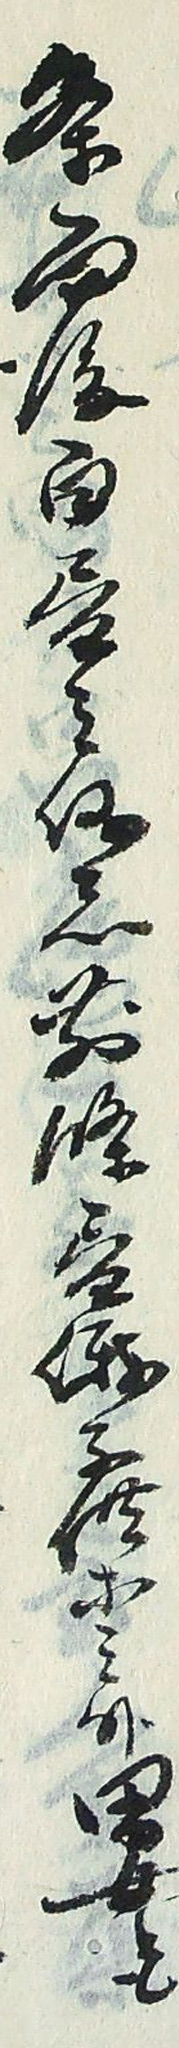条向後白晝之儀者前條晝俄子供等之外男女とも
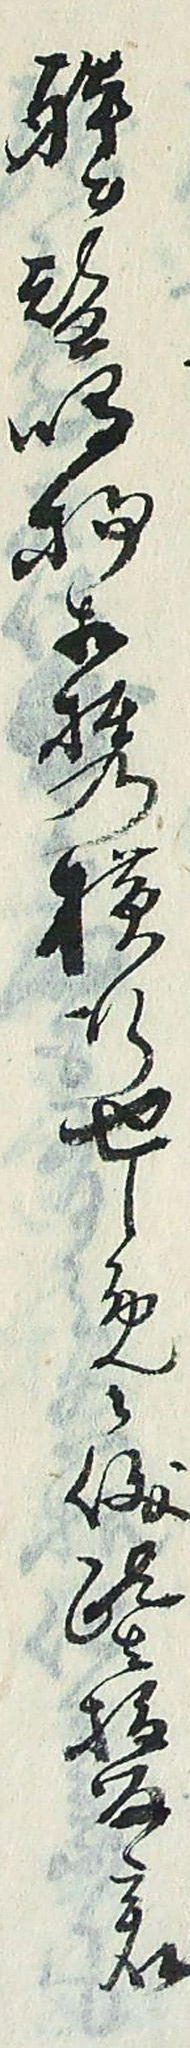躰ヲ替鳴持相携横行せしめ候儀屹と指留候以上若

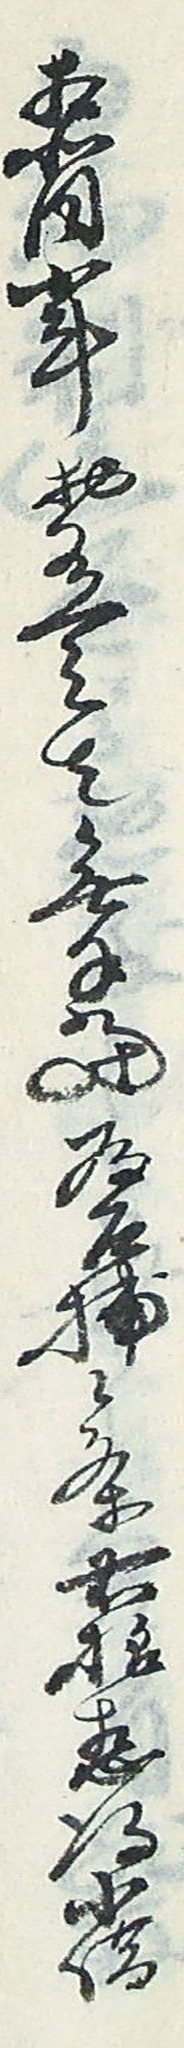相背輩於有之者無手當為召捕候条右様相心得小借
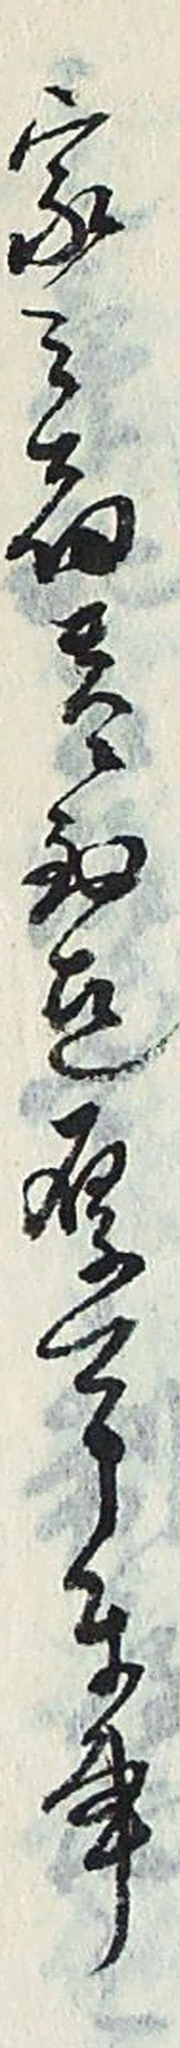家之者共ニ到迄厚可申付事
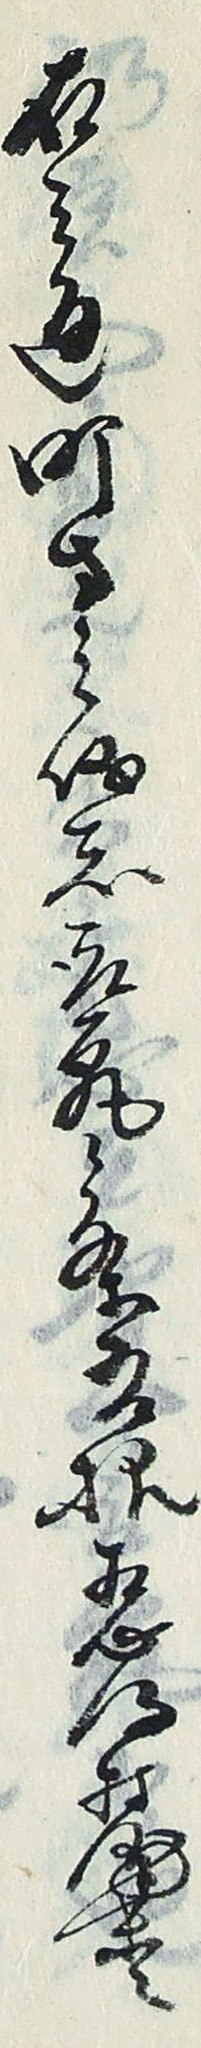右之通町方之儀者取究候条右様相心得村浦末々
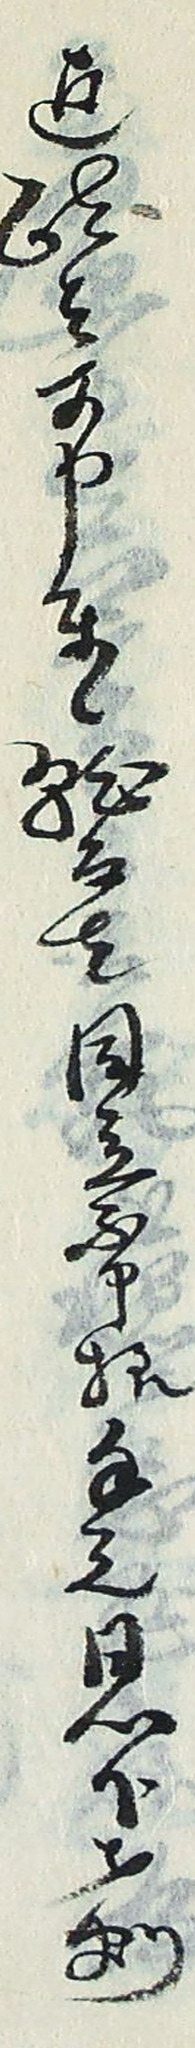迄屹と可申付候就而者目立不申様手元同心下才判
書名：諸御趣意書并御下知向之写
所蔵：鳴門教育大学 Naruto University of Education
